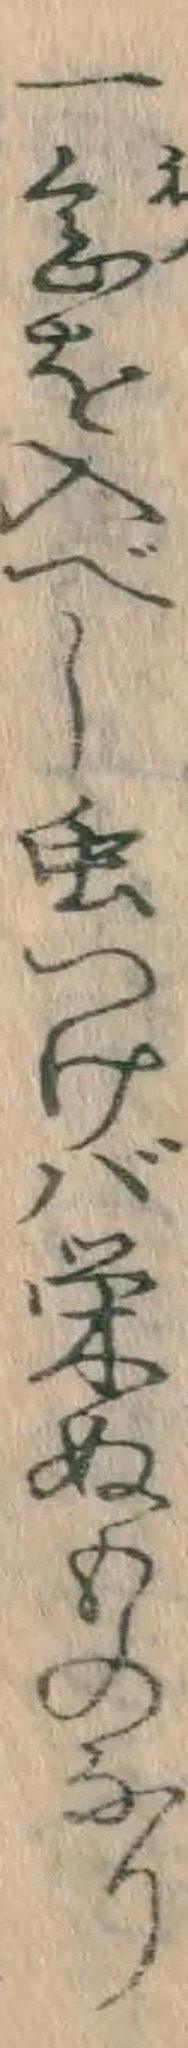一念を入べし虫つけば栄ぬものなり
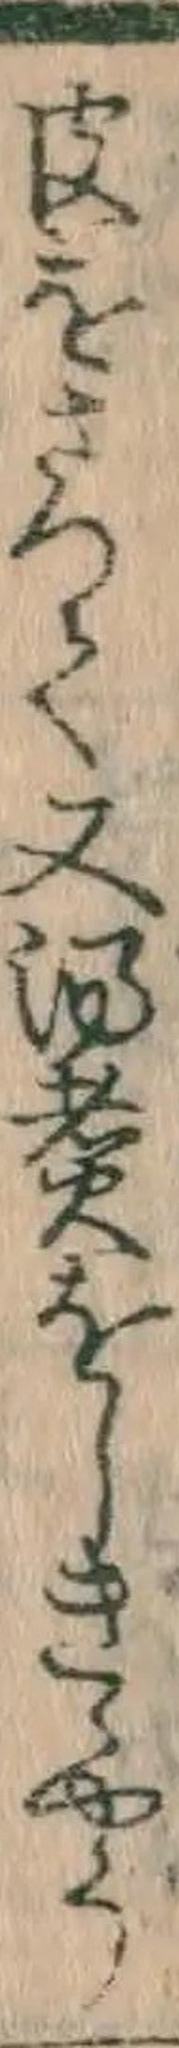皮をさつて又湯煮をしきゝやう
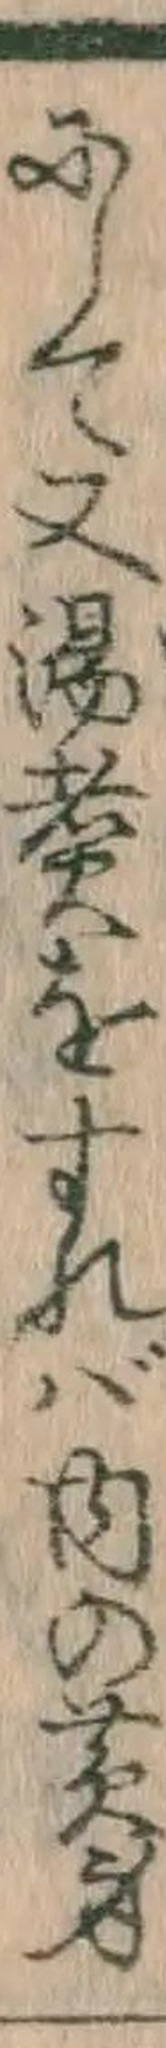にして又湯煮をすれば内の黄身
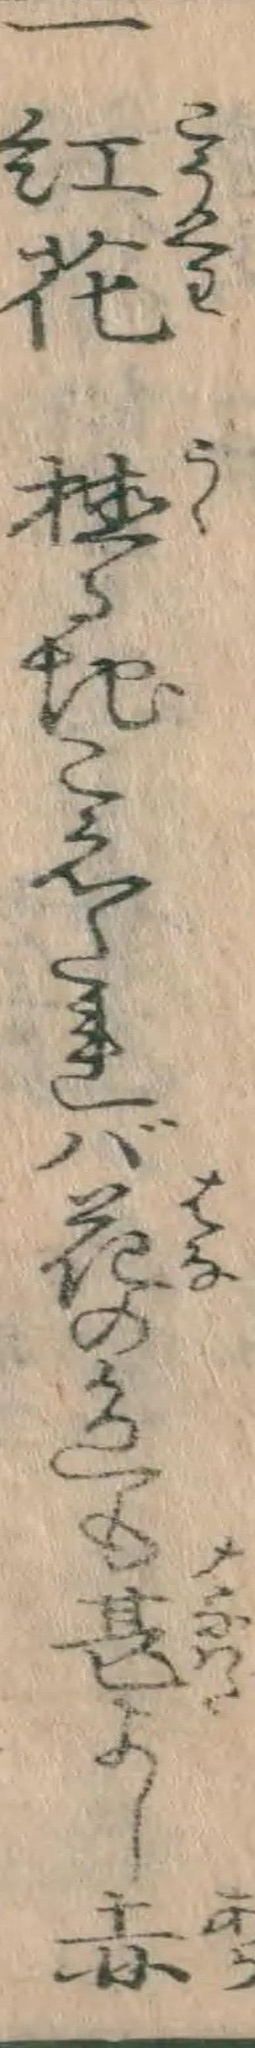一紅花植る地こえたれば花の色も甚よし赤
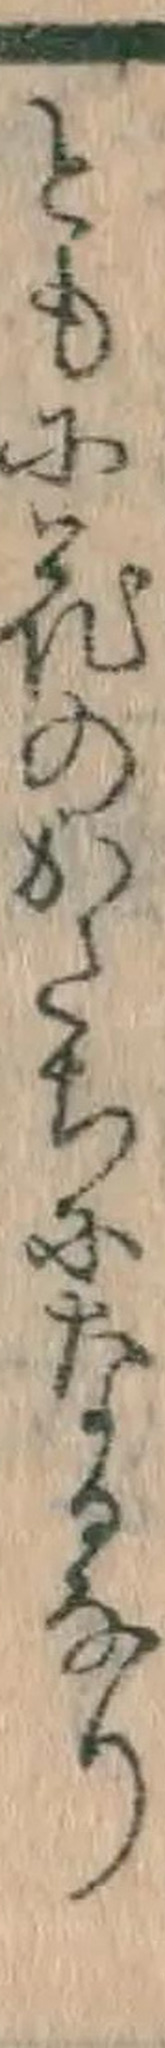ともに花のかたちになるなり
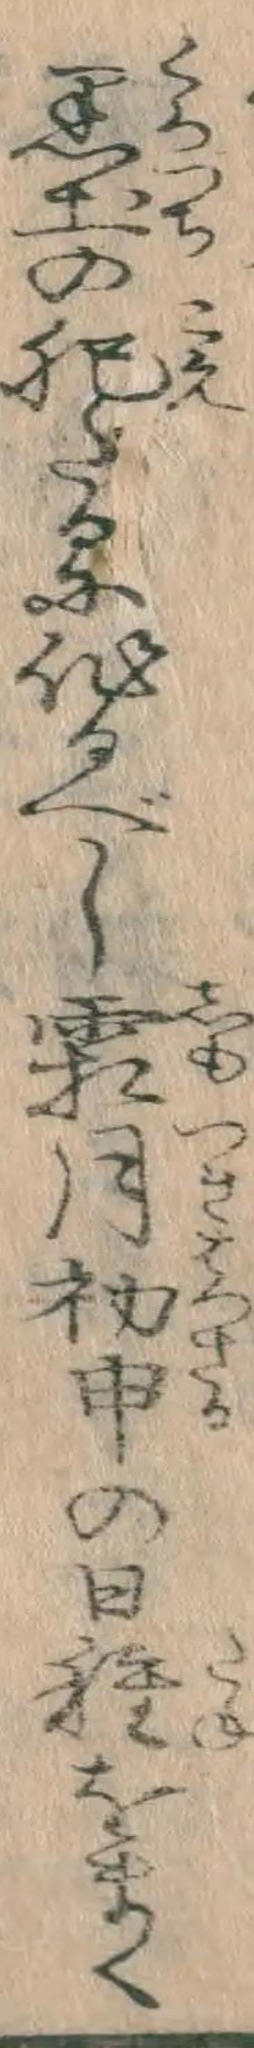黒土の肥たるに作るべし霜月初申の日種をまく
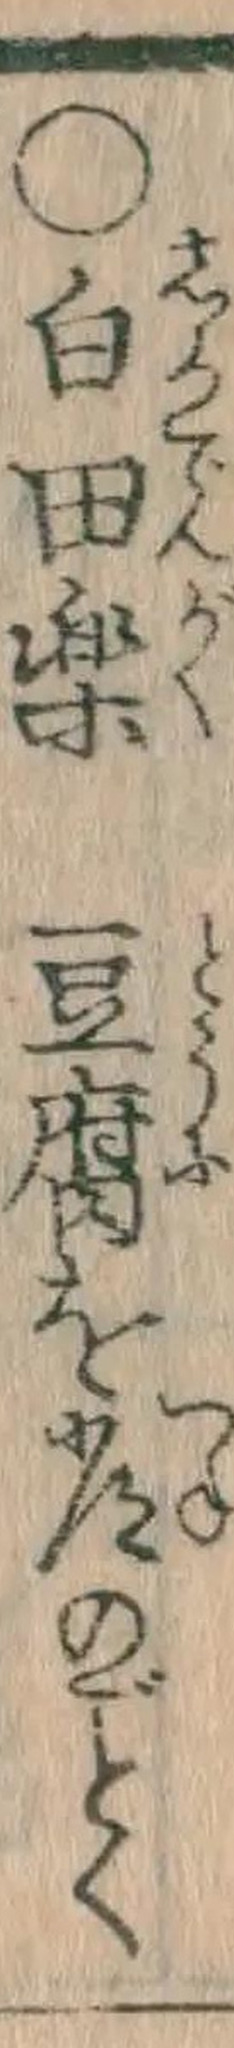○白田楽豆腐を常のごとく
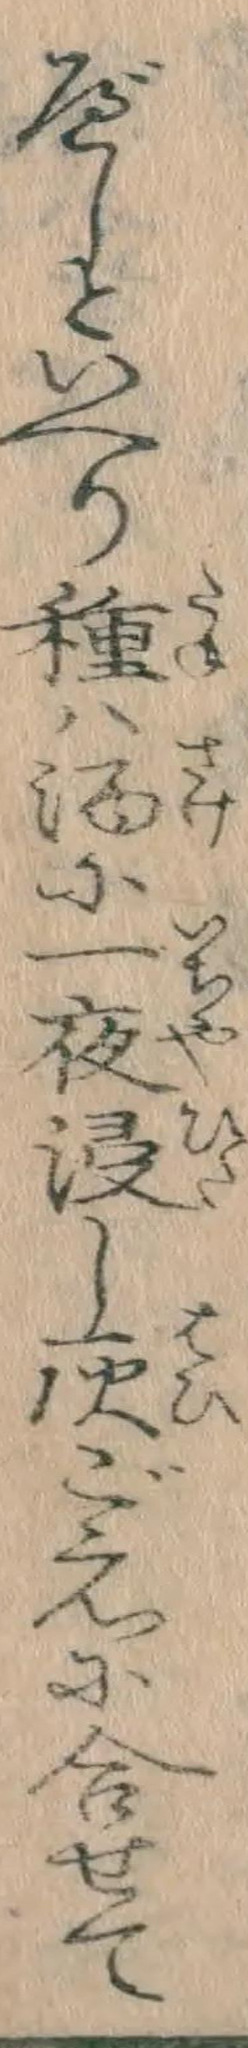べしといへり種は酒に一夜浸し灰ごえに合せて
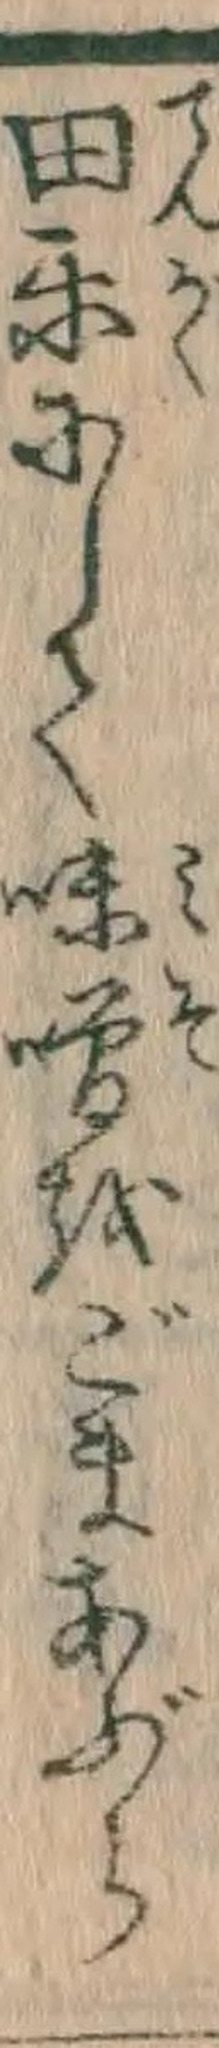田楽にして味噌をごまあぶら
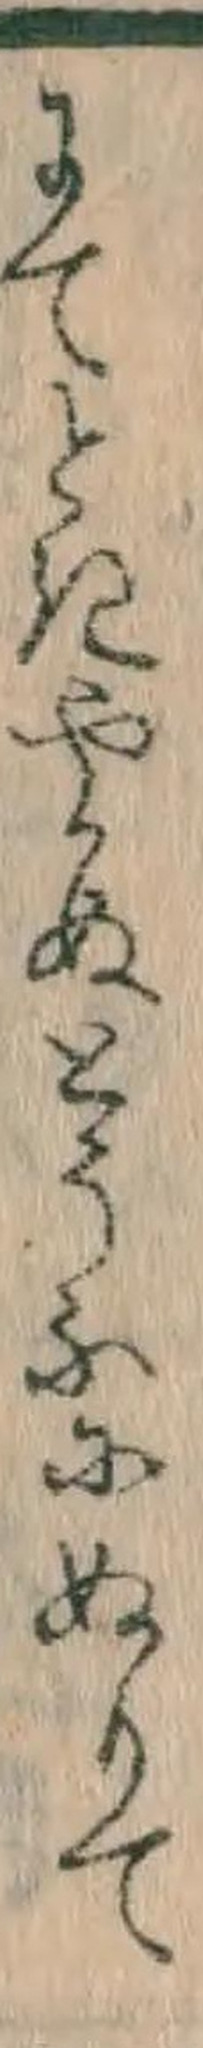にてときやかぬとうふにぬりて
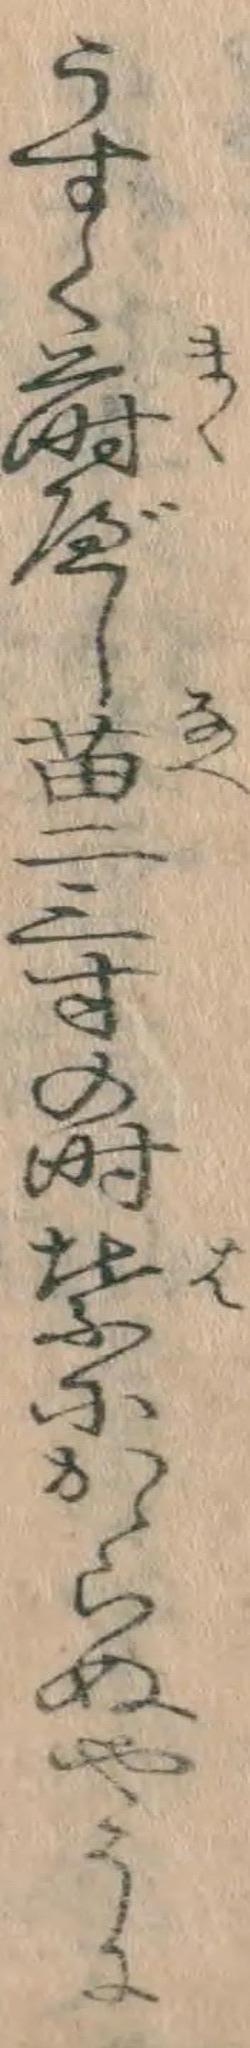うすく蒔べし苗二三寸の時葉にかゝらぬやうに
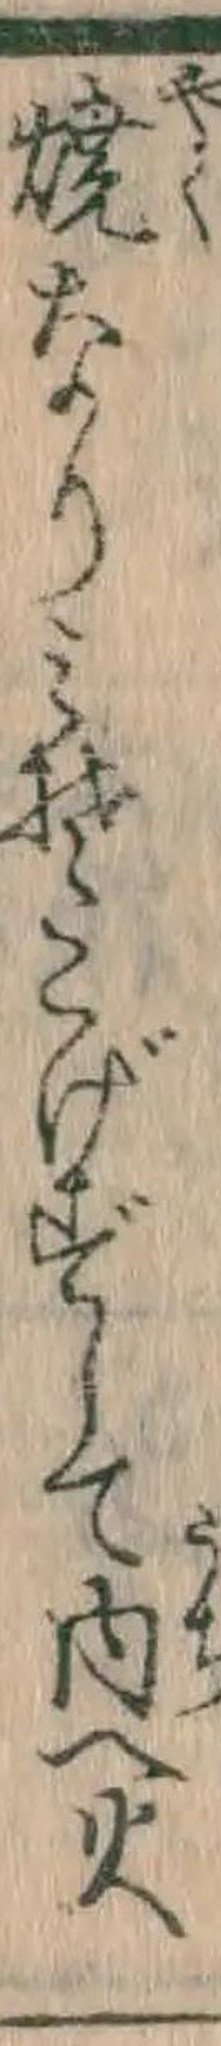焼なりみそこげずして内へ火
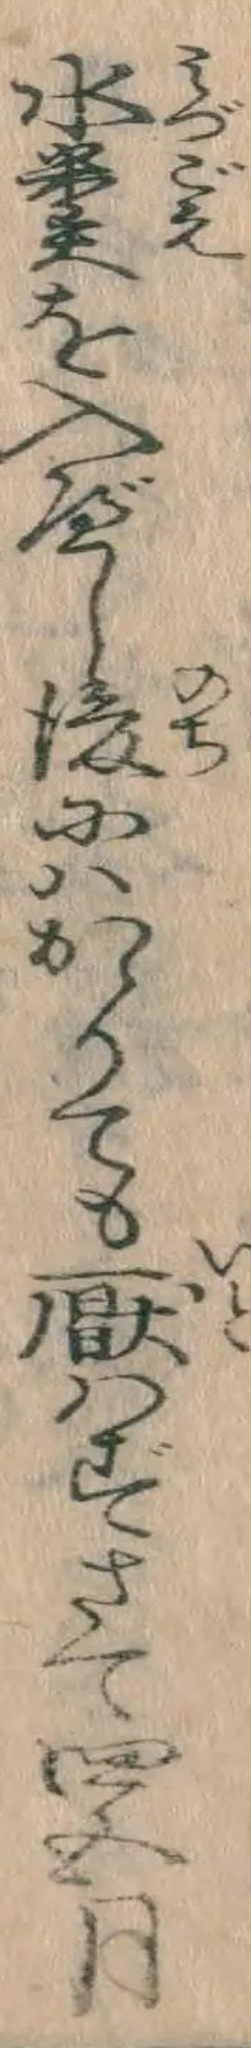水糞を入べし後にはかゝりても厭はずさて四五月
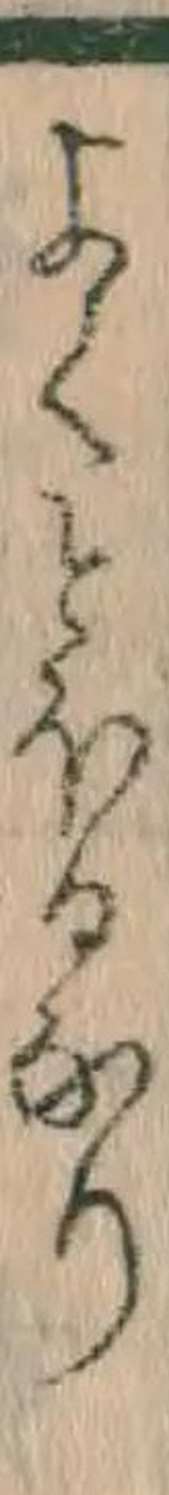よくとほるなり
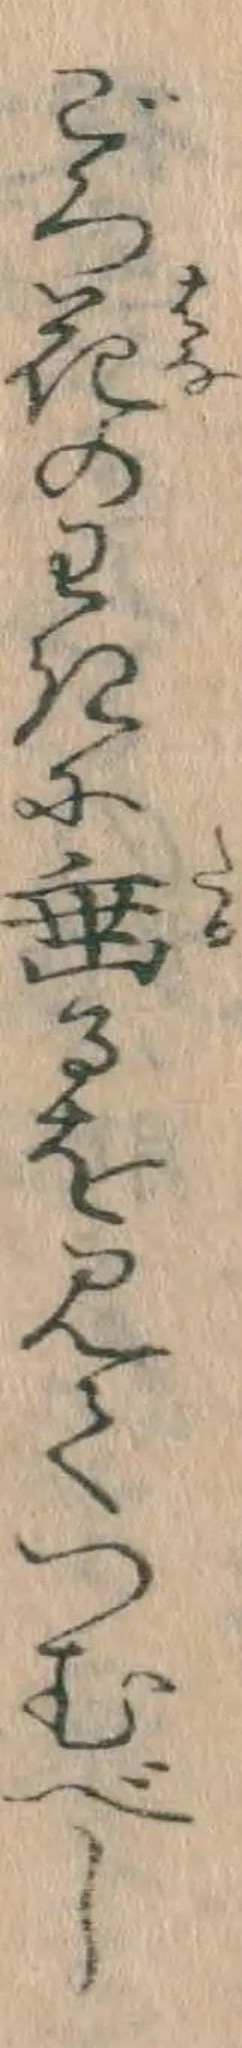ごろ花のわきに垂るを見てつむべし
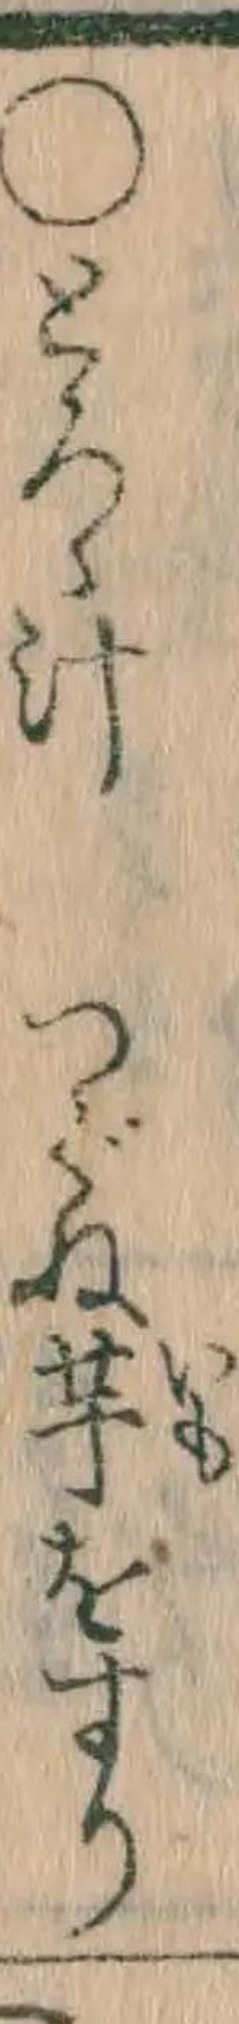○とろゝ汁つぐね芋をすり
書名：広益秘事大全 3巻. [5]
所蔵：国立国会図書館 National Diet Library, JAPAN
